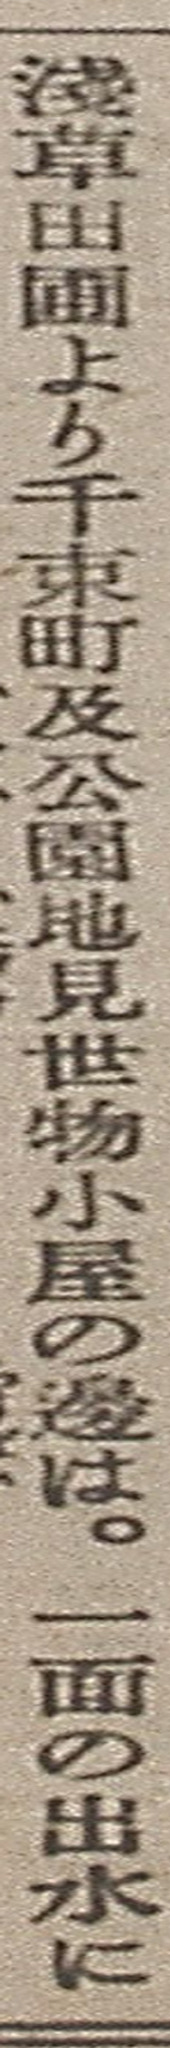浅草田圃より千束町及公園地見世物小屋の辺は。一面の出水に
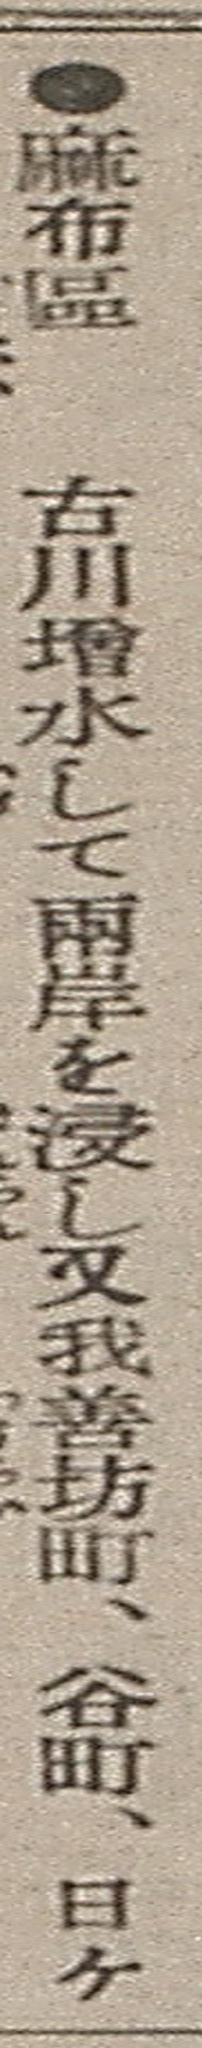●麻布区古川増水して両岸を浸し又我善坊町、谷町、日ケ
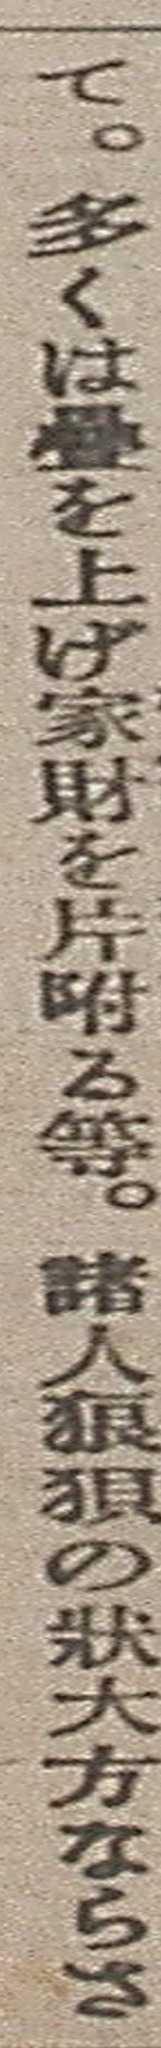て。多くは畳を上げ家財を片付る等。諸人狼狽の状大方ならさ
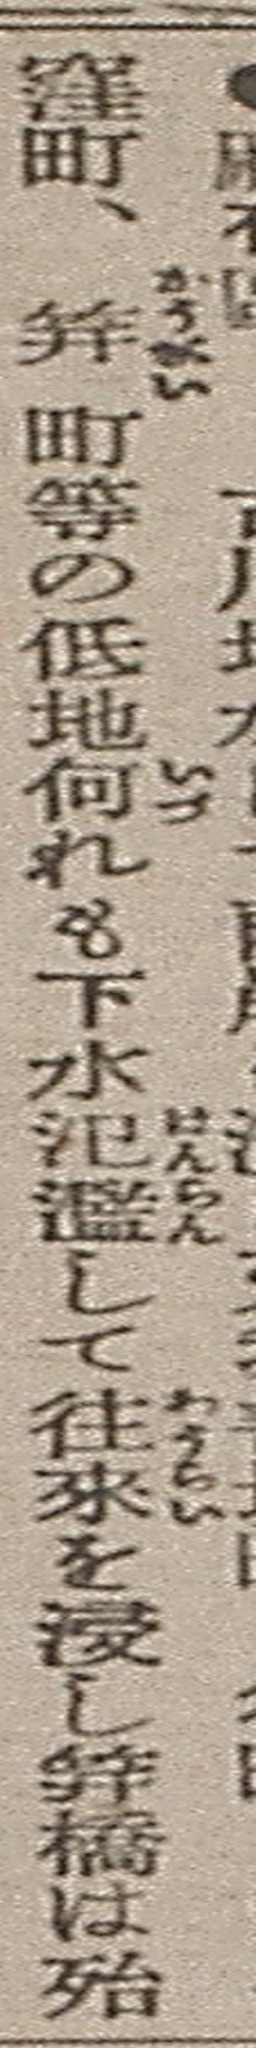窪町、笄町等の低地何れも下水氾濫して往来を浸し笄橋は殆
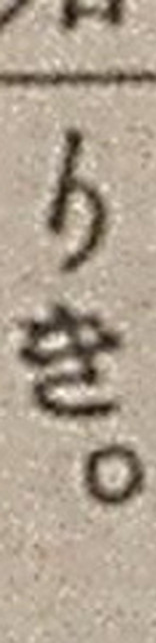りき。
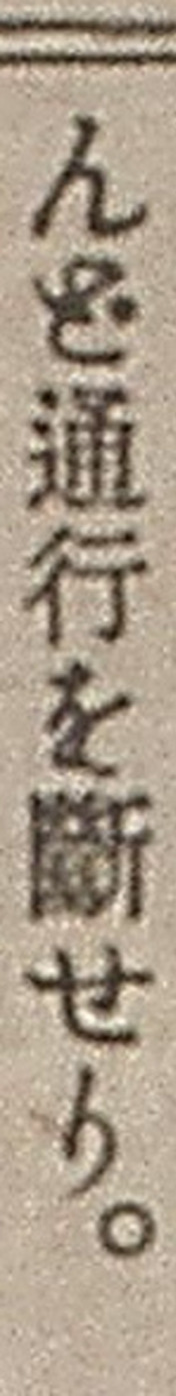んど通行を断せり。
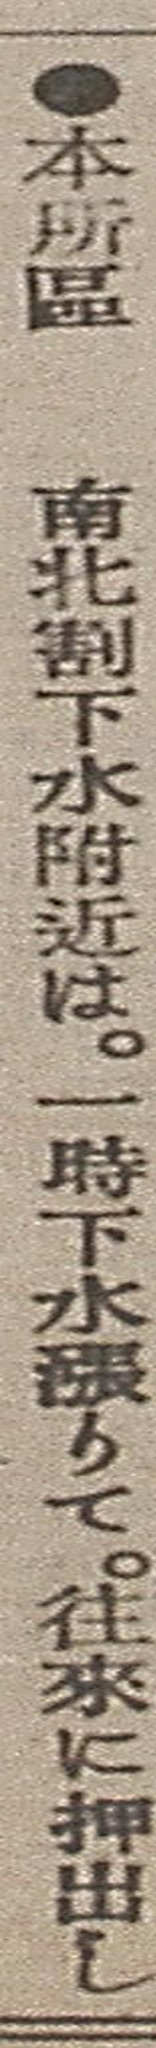●本所区南北割下水付近は。一時下水漲りて。往来に押出し
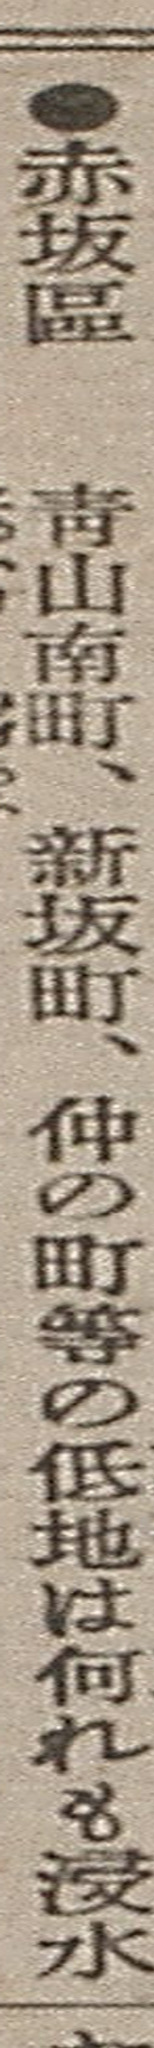●赤坂区青山南町、新坂町、仲の町等の低地は何れも浸水
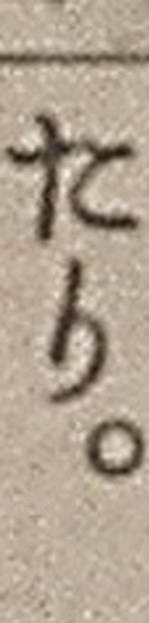たり。
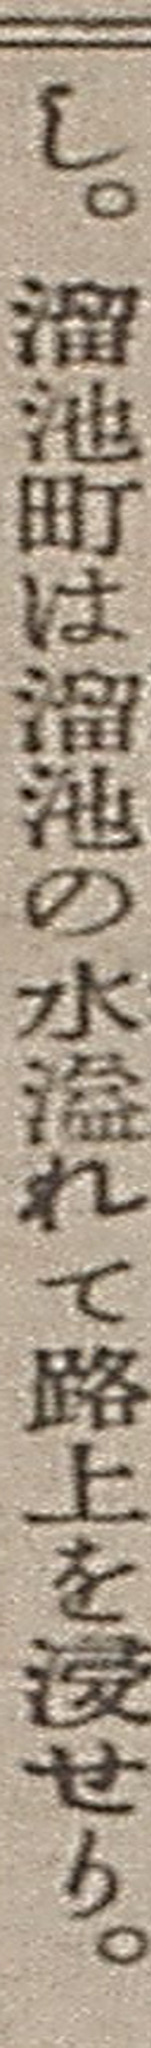し。溜池町は溜池の水溢れて路上を浸せり。
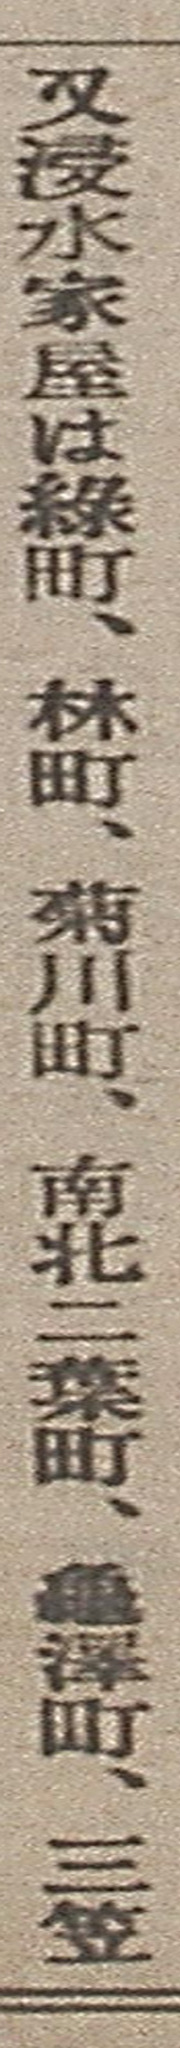又浸水家屋は緑町、林町、菊川町、南北二葉町、亀澤町、三笠
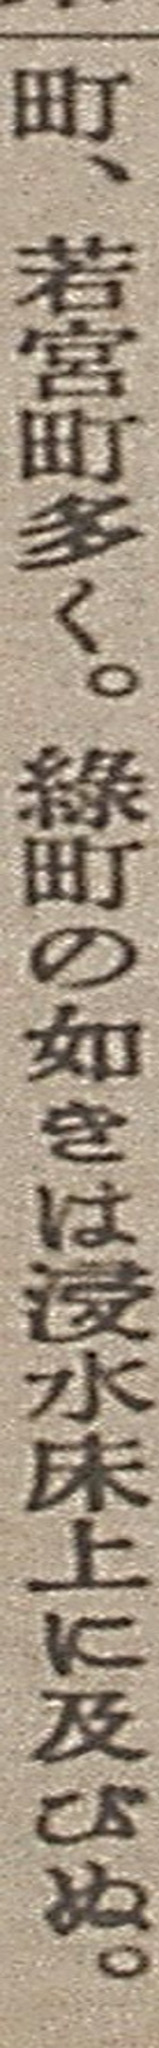町、若宮町多く。緑町の如きは浸水床上に及びぬ。
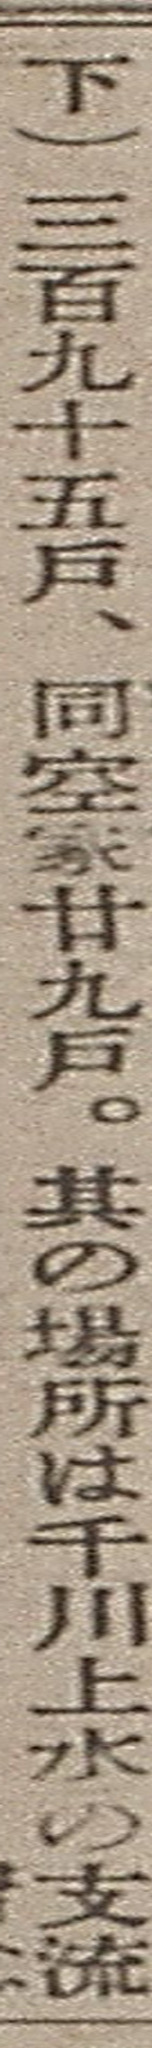下）三百九十五戸、同空家廿九戸。其の場所は千川上水の支流
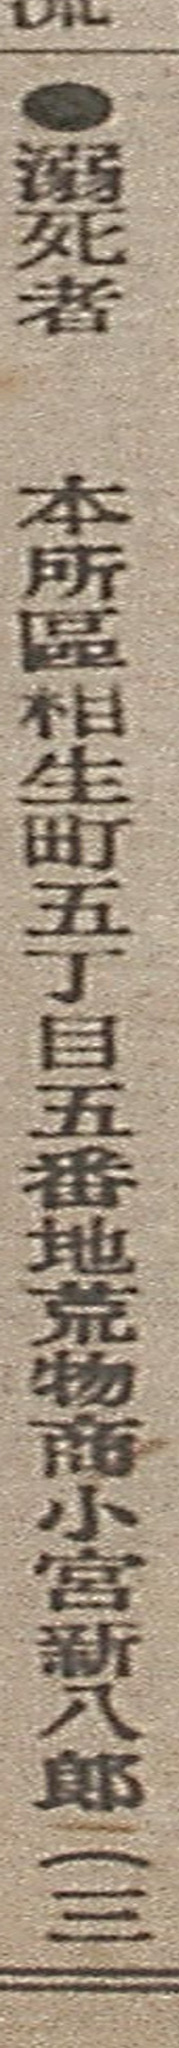●溺死者本所区相生町五丁目五番地荒物商小宮新八郎（三
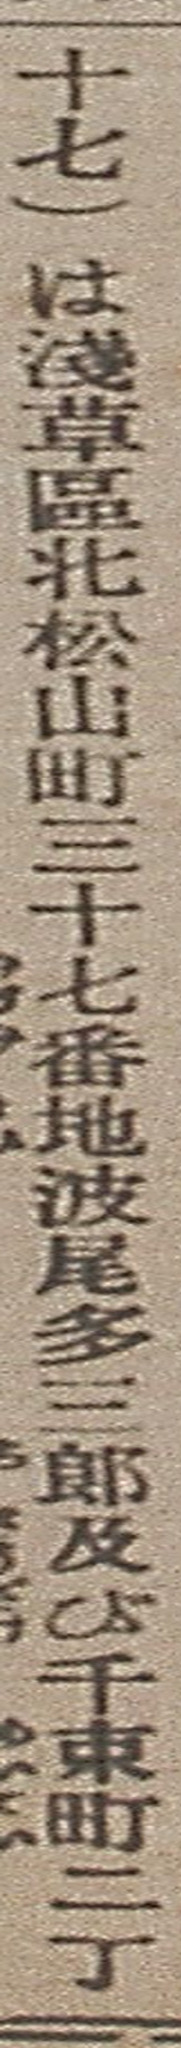十七）は浅草区北松山町三十七番地波尾多三郎及び千束町二丁
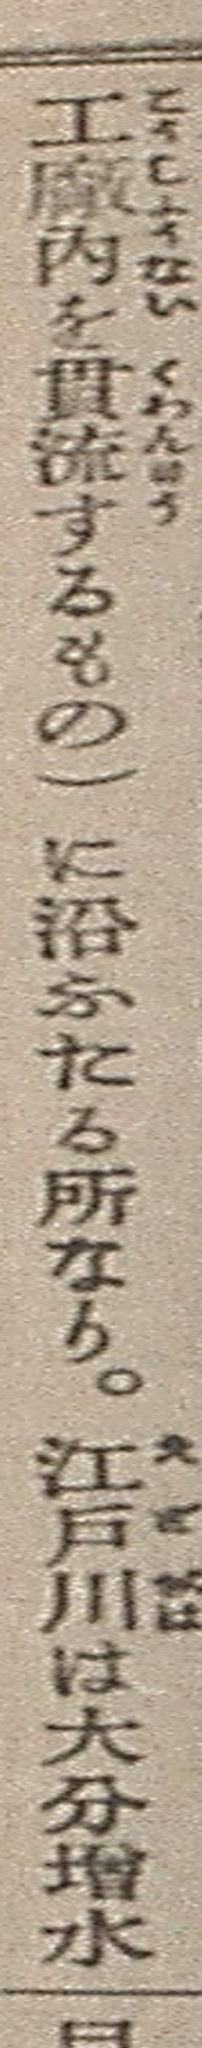工廠内を貫流するもの）に沿ふたる所なり。江戸川は大分増水
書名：風俗畫報臨時増刊第百九十九號　明治三十二年十月各地災害圖會（前編之續）
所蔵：東京大学地震研究所図書室 Earthquake Research Institute Library, The University of Tokyo, JAPAN
